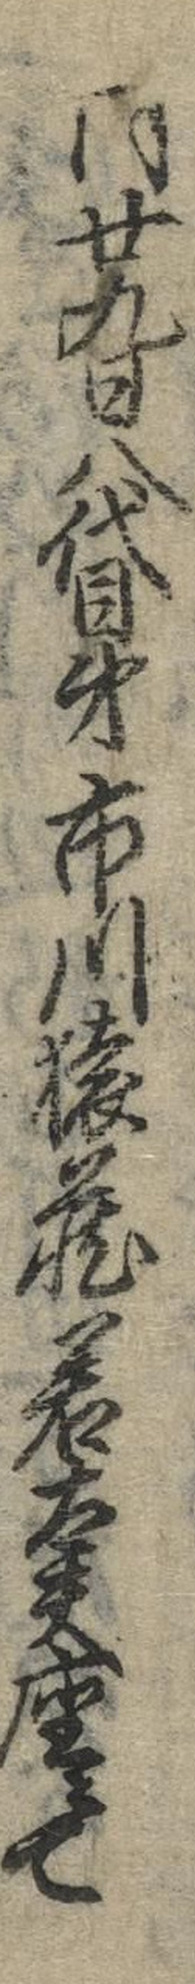同廿九日八代目弟市川猿蔵若太夫座ニて
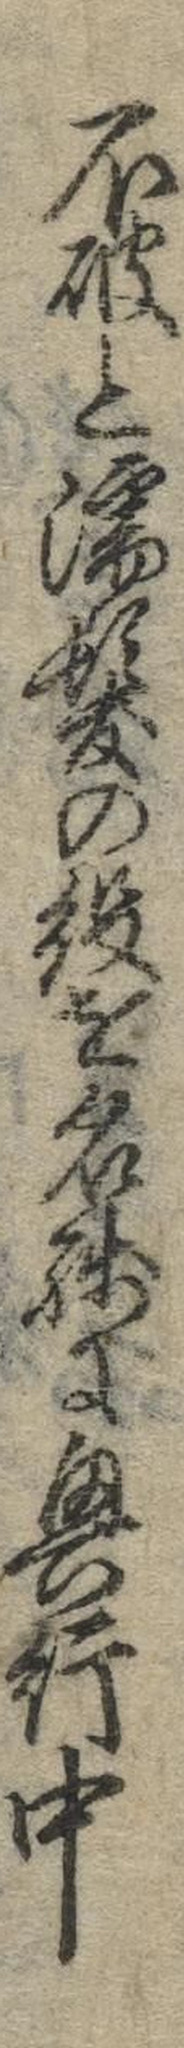不破と濡髪の役を名残に興行中
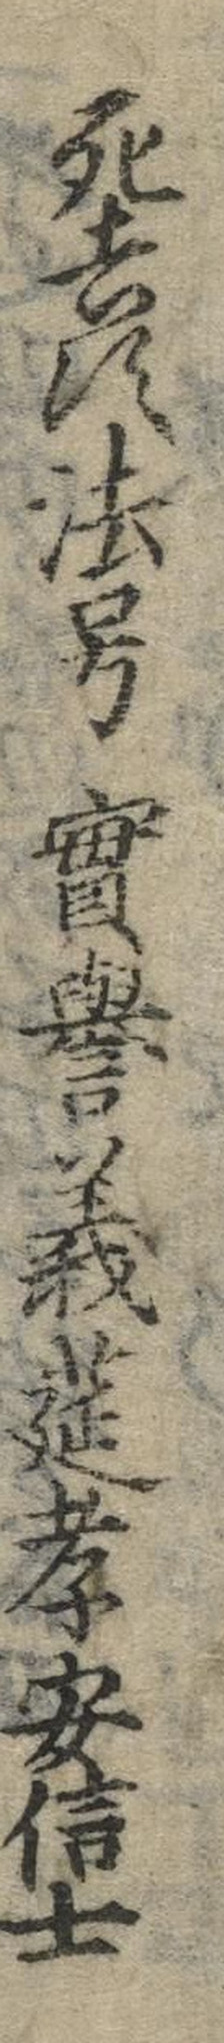死去す法号実誉義筵孝安信士
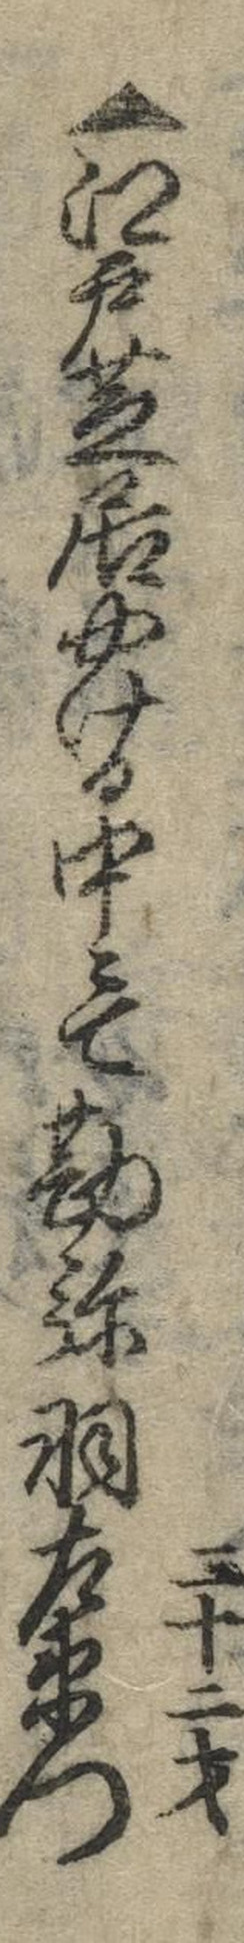▲江戸芝居やけるなかニて勘弥羽左衛門
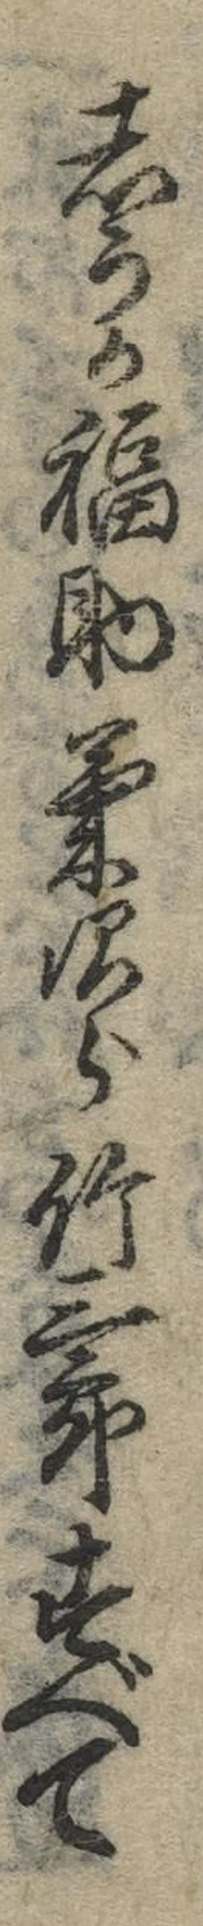しうか福助菊次郎竹三郎すべて
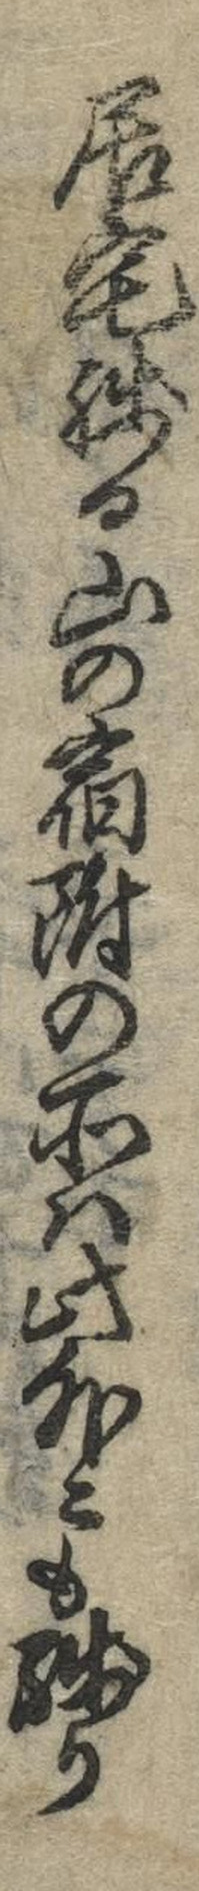居宅残る山の宿附の所ハ此外ニも残り
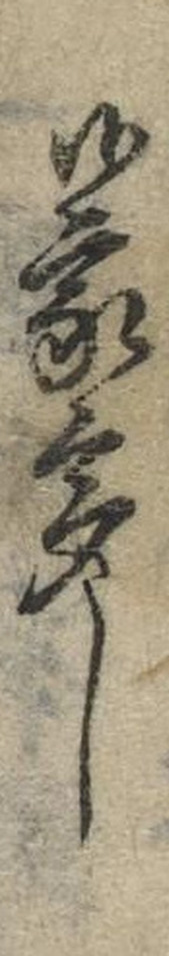候家多し
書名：江戸御屋鋪方町方共　地震類焼場所巨細書之寫　潰家潰土蔵共取調附街道筋近在迄
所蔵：東京大学地震研究所図書室 Earthquake Research Institute Library, The University of Tokyo, JAPAN
